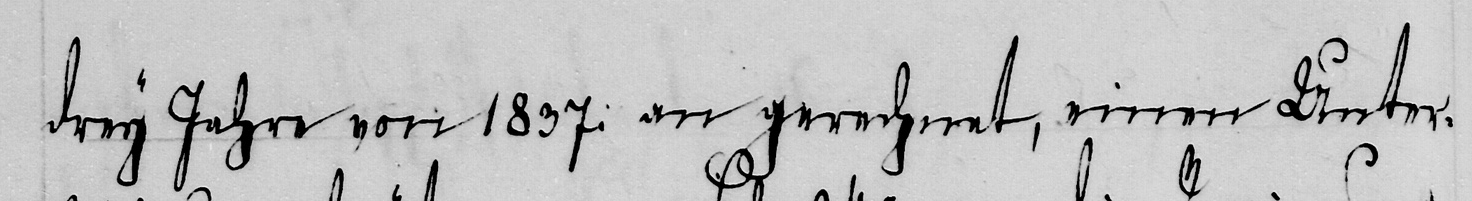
drey Jahre von 1837. an gerechnet, einen Unter¬
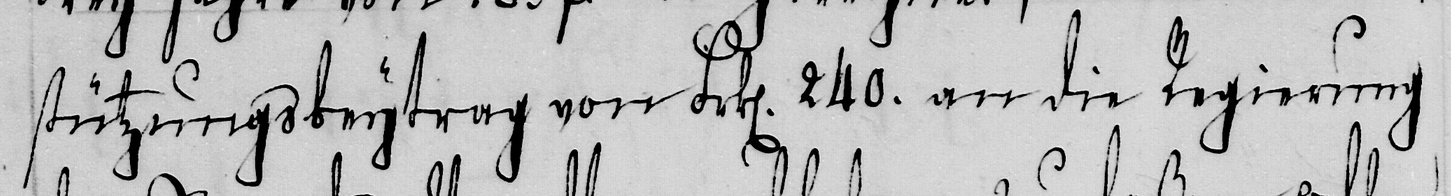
stützungsbeytrag von Frk[en]. 240. an die Regierung
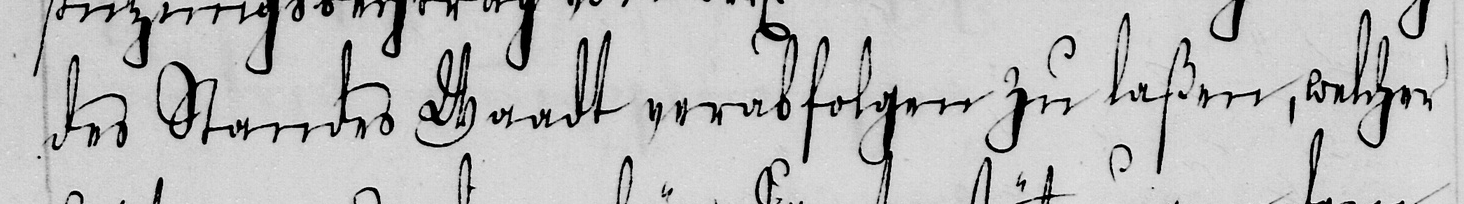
des Standes Waadt verabfolgen zu laßen, welcher
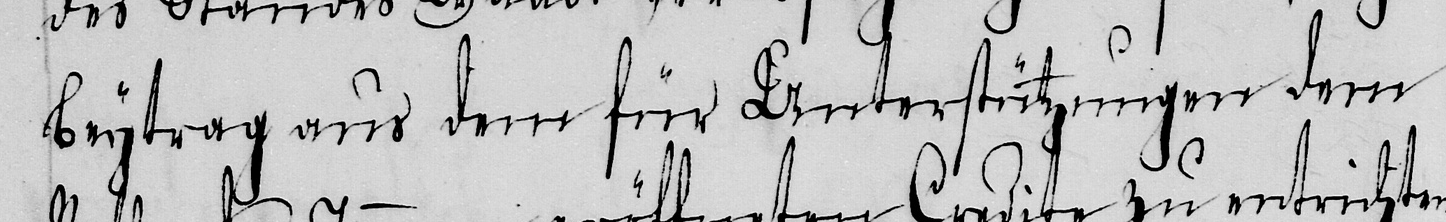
Beytrag aus dem für Unterstützungen dem
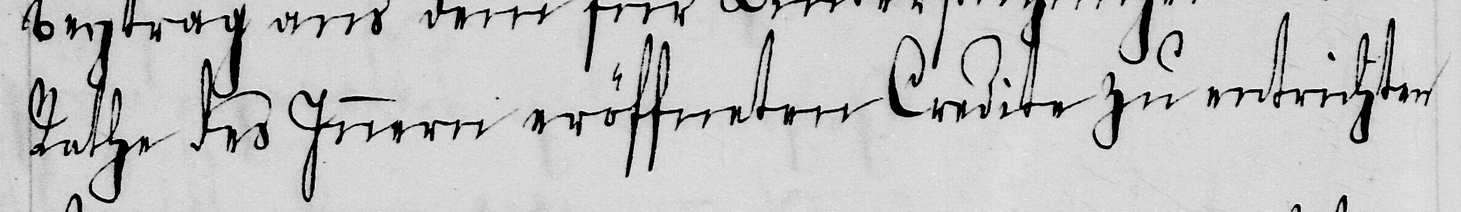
Rathe des Innern eröffneten Credite zu entrichten
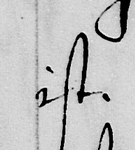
ist.
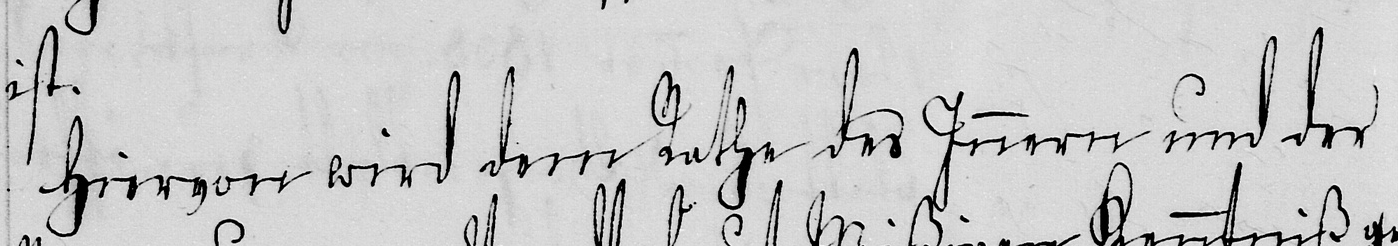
Hiervon wird dem Rathe des Innern und der
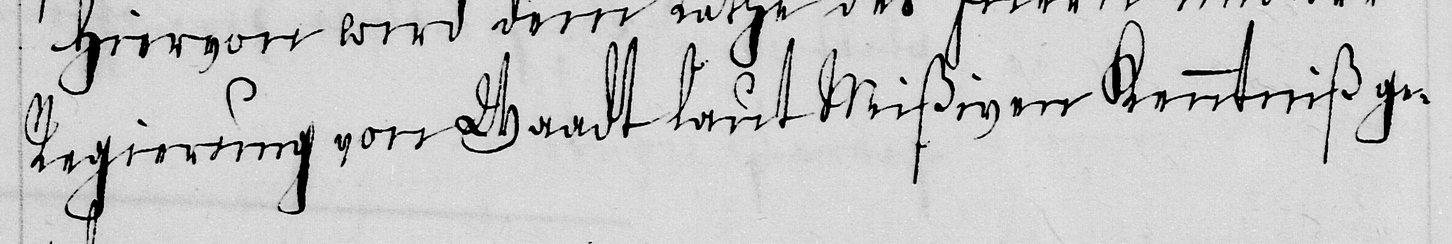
Regierung von Waadt laut Mißiven Kenntniß ge¬
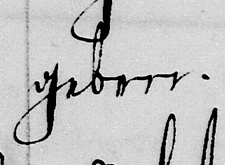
geben.
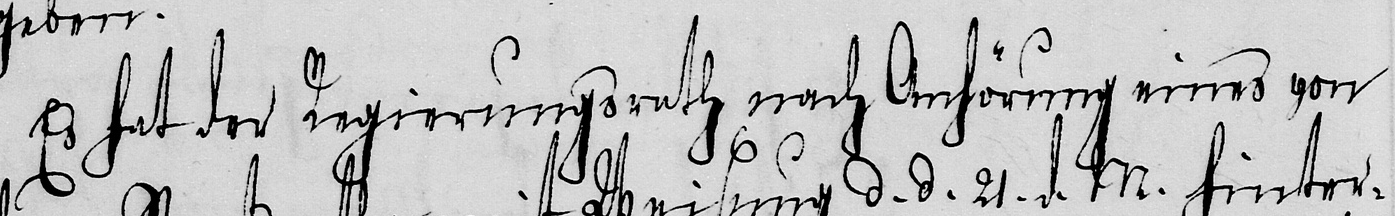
Es hat der Regierungsrath nach Anhörung eines von
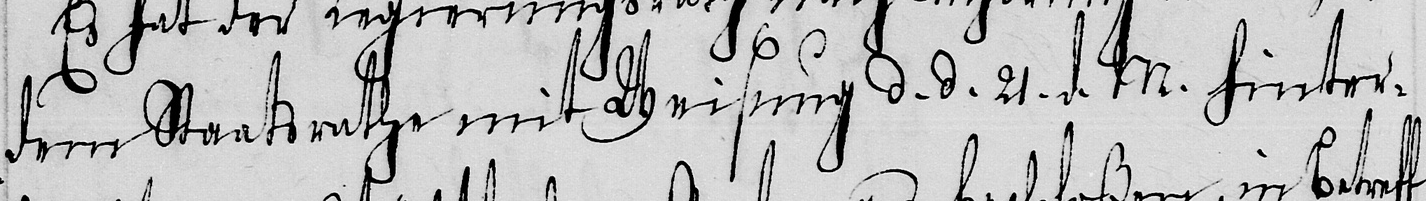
dem Staatsrathe mit Weisung d. d. 21. d. M. hinter¬
